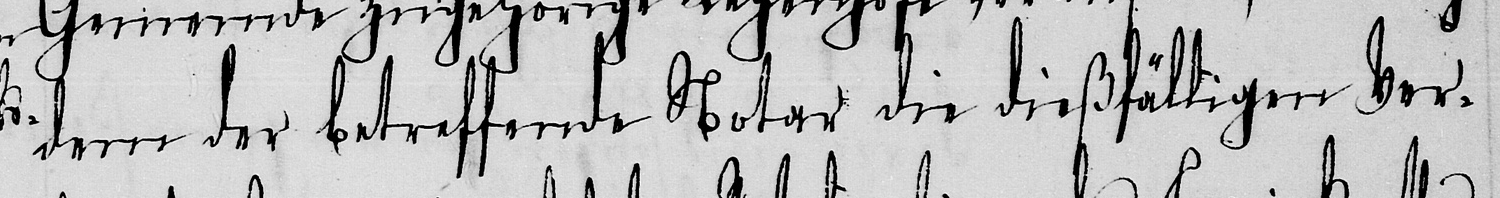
dem der betreffende Notar die dießfälligen Ver¬
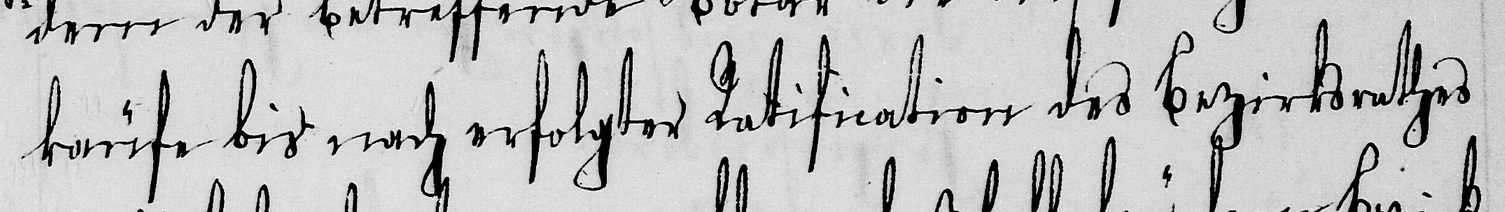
käufe bis nach erfolgter Ratification des Bezirksrathes
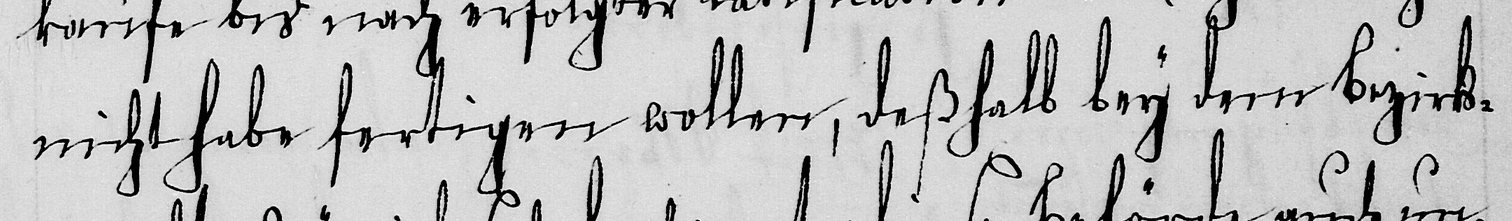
nicht habe fertigen wollen, deßhalb bey dem Bezirks¬
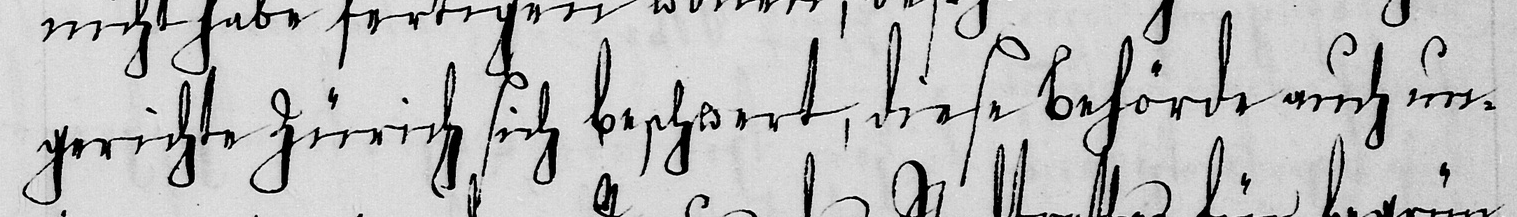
gerichte Zürich sich beschwert, diese Behörde auch un¬
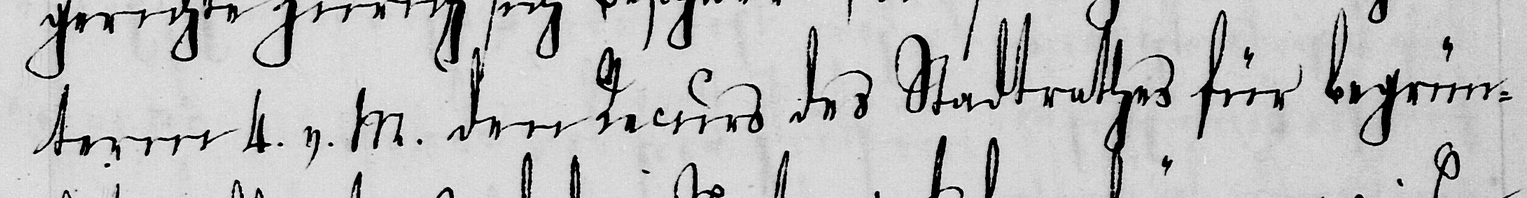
term 4. v. M. den Recurs des Stadtrathes für begrün¬
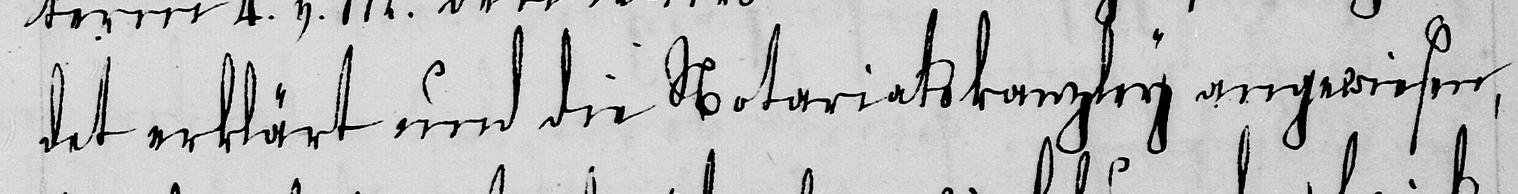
det erklärt und die Notariatskanzley angewiesen,
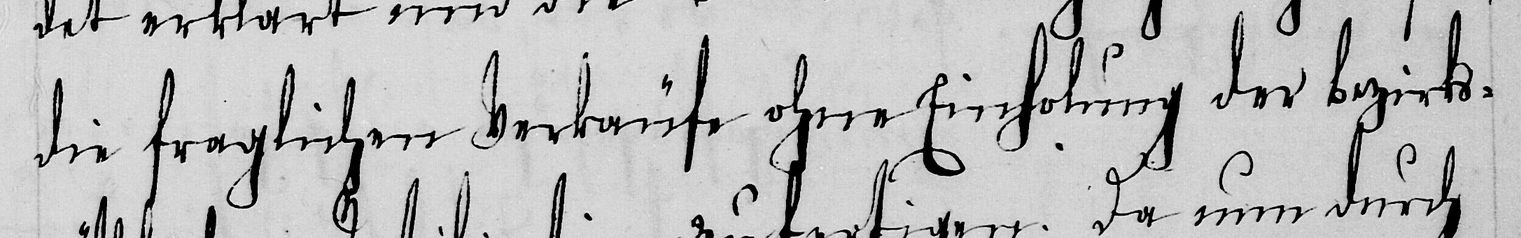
die fraglichen Verkäufe ohne Einholung der bezirks¬
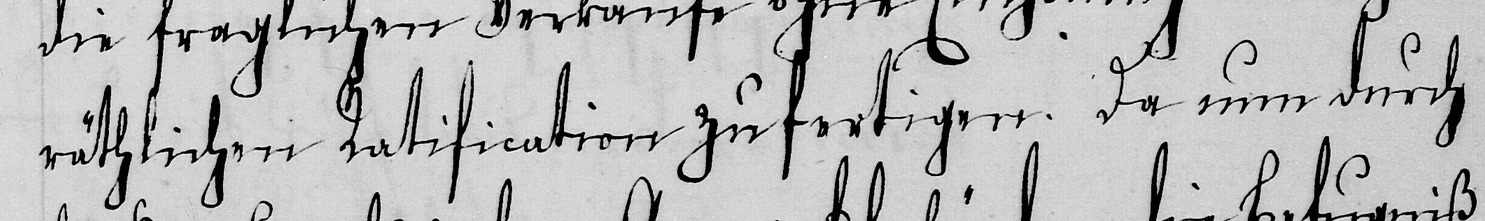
räthlichen Ratification zu fertigen. Da nun durch
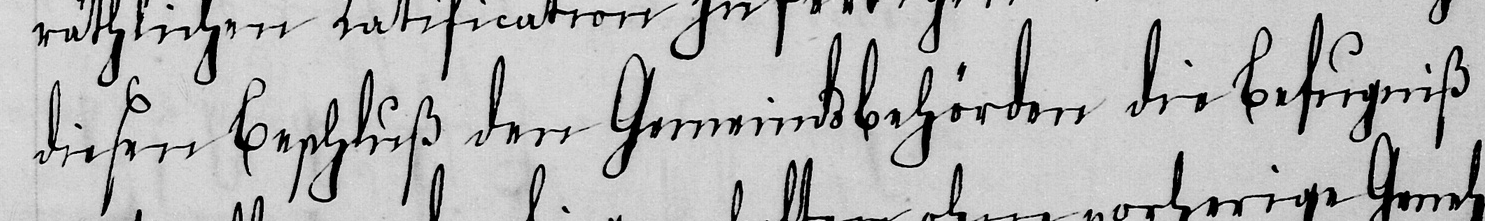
diesen Beschluß den Gemeindsbehörden die Befugniß
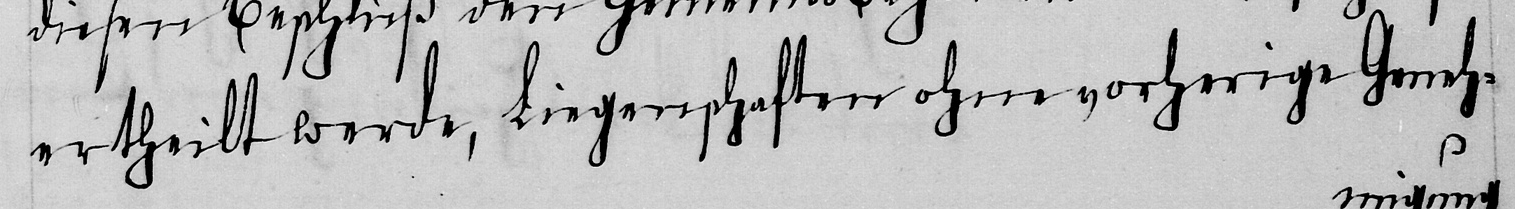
ertheilt werde, Liegenschaften ohne vorherige Geneh-
